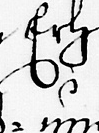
16.
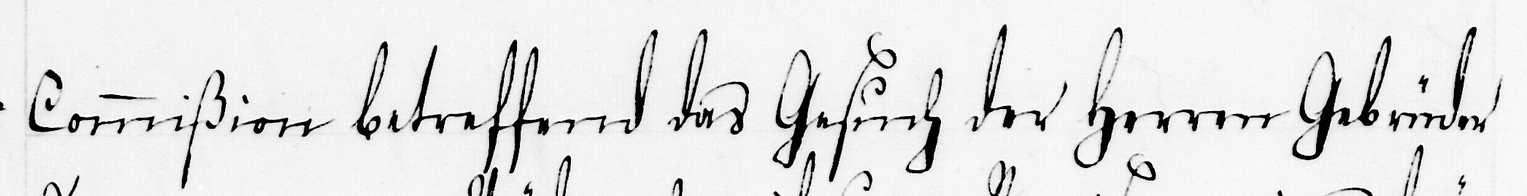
Commißion betreffend das Gesuch der Herren Gebrüder
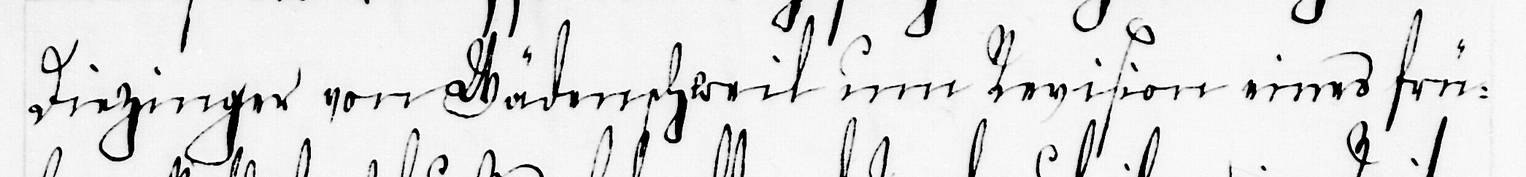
Diezinger von Wädenschweil um Revision eines frü¬
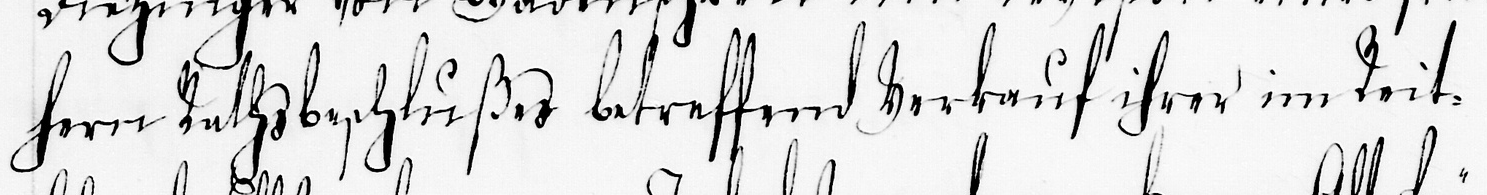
hern Rathsbeschlußes betreffend Verkauf ihrer im Reit¬
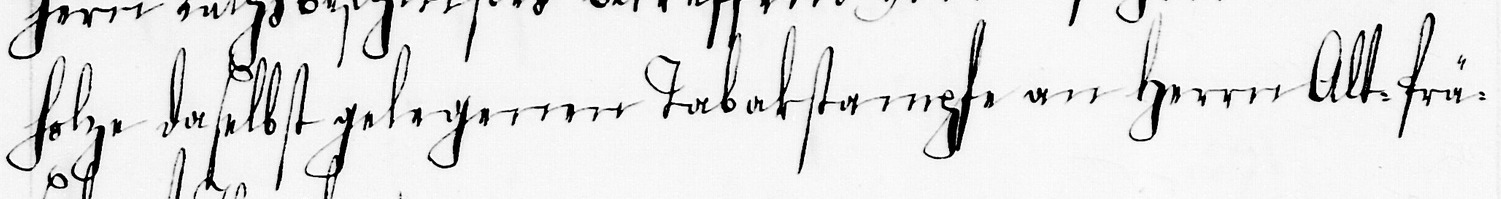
holze daselbst gelegenen Tabakstampfe an Herrn Alt-Prä¬
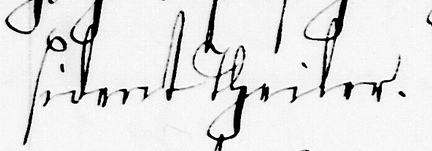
sident Theiler.
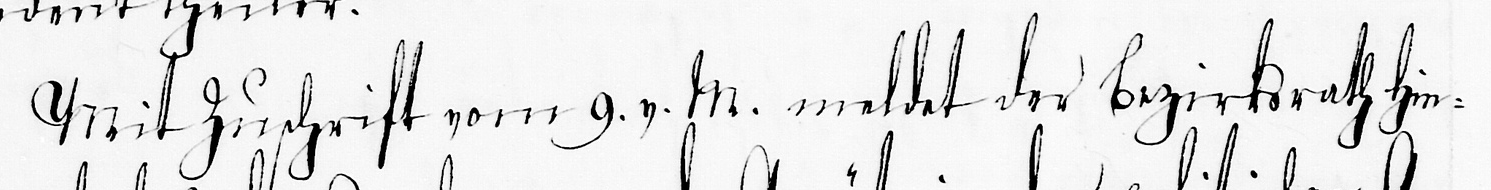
Mit Zuschrift vom 9. v. M. meldet der Bezirksrath Hin¬
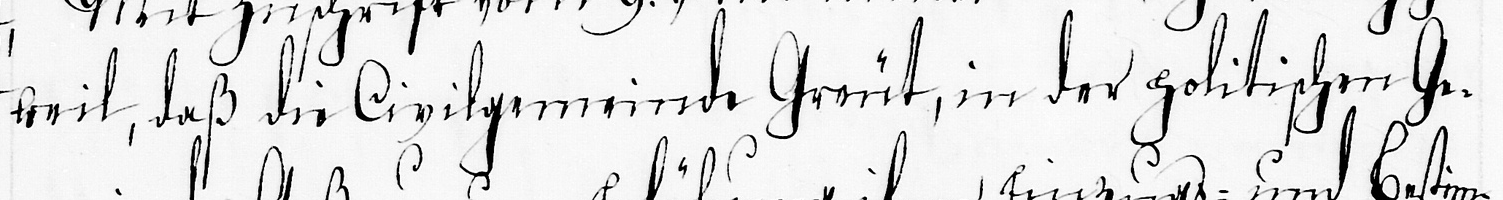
weil, daß die Civilgemeinde Greut, in der politischen Ge¬
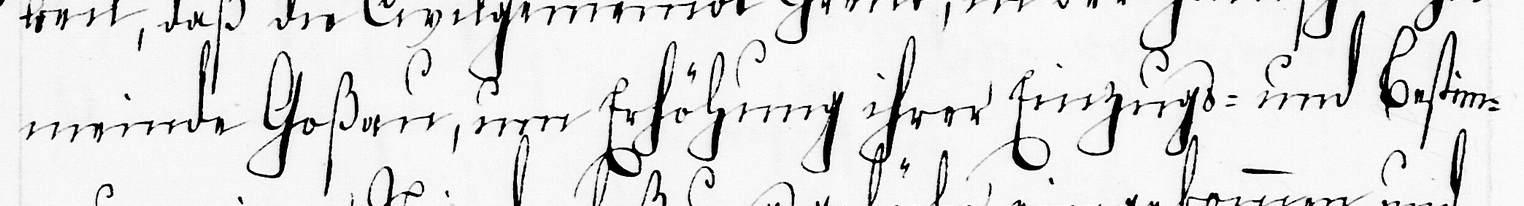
meinde Goßau, um Erhöhung ihrer Einzugs- und Besti¬
